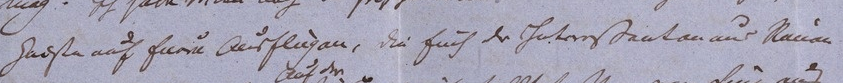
Geiste auf Euern Ausflügen, die Euch des Intereßanten und Neuen
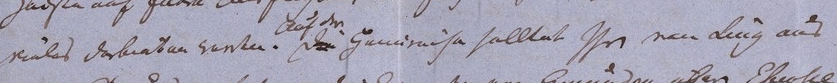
vieles darbieten werden. Auf der Heimreise solltet Ihr von Linz aus
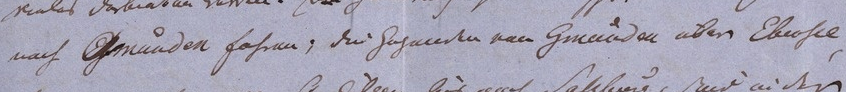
nach Gmunden fahren; die Gegenden von Gmunden über Ebensee
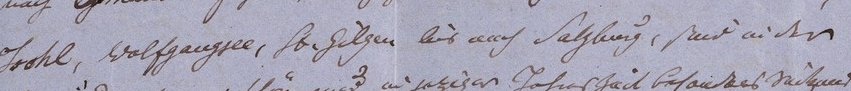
Ischl, Wolfgangsee, St. Gilgen bis nach Salzburg, sind in der
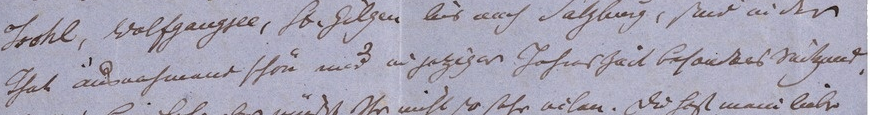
That ausnehmend schön und in jetziger Jahreszeit besonders reitzend.
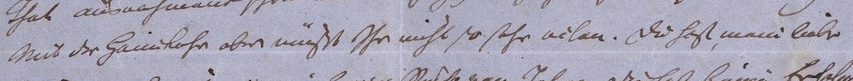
Mit der Heimkehr aber müßt Ihr nicht so sehr eilen. Du hast, mein lieber
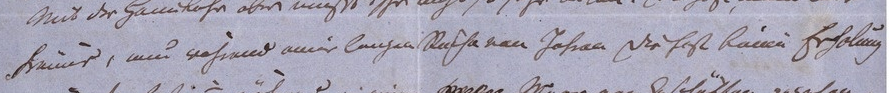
Freund, nun während einer langen Reihe von Jahren Dir fast keine Erholung
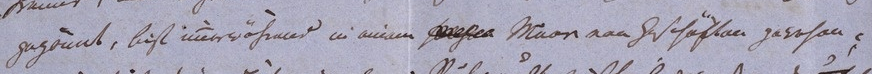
gegönnt, bist immerwährend in einem ...Meer von Geschäften gewesen;
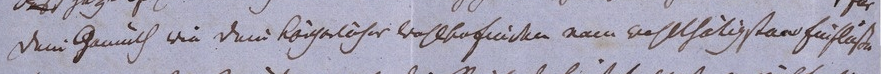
Dein Gemüth wie Dein körperliches Wohlbefinden vom wohlthätigsten Einfluße
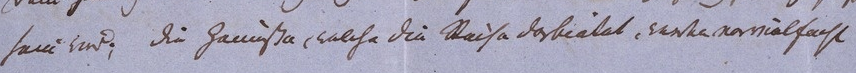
sein wird; die Genüße, welche die Reise darbietet, werden vervielfacht
